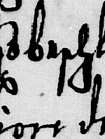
4.)
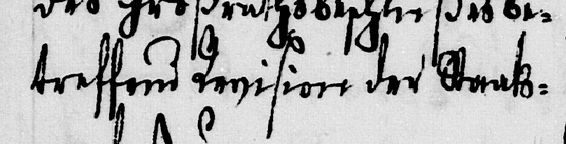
treffend Revision der Staats¬
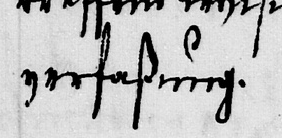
verfaßung
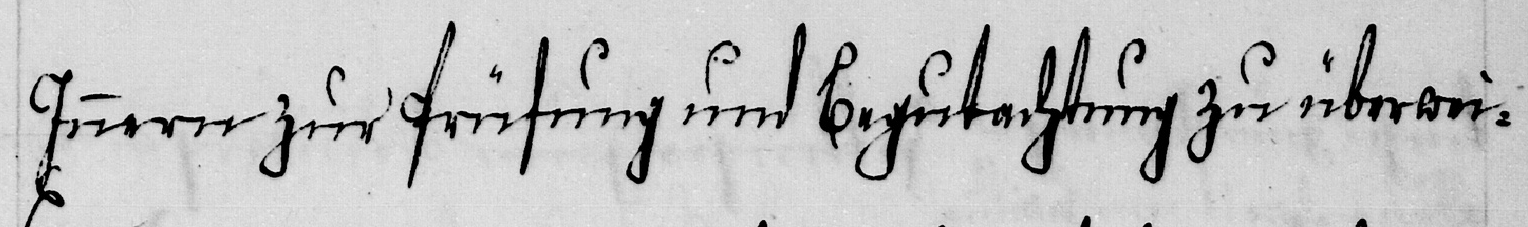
Innern zur Prüfung und Begutachtung zu überwei¬
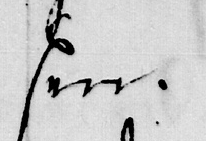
sen.
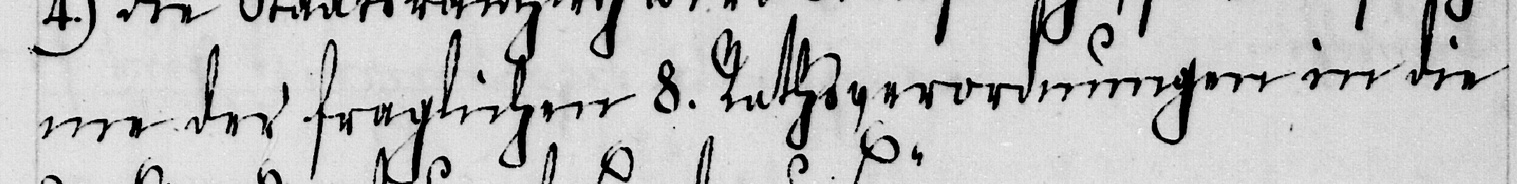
me der fraglichen 8. Rathsverordnungen in die
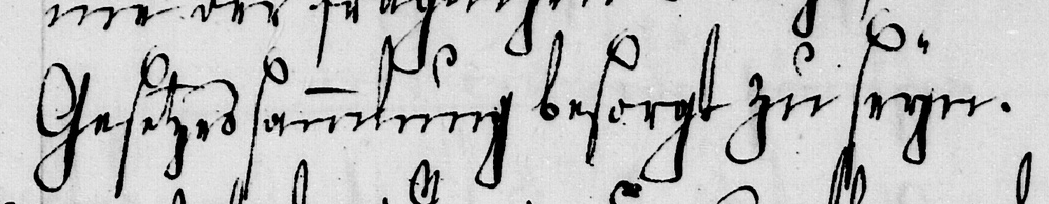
Gesetzessammlung besorgt zu seyn.
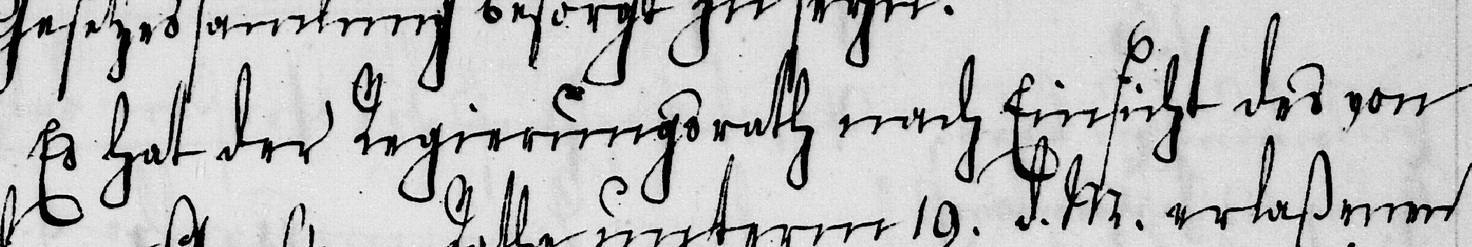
Es hat der Regierungsrath nach Einsicht des von
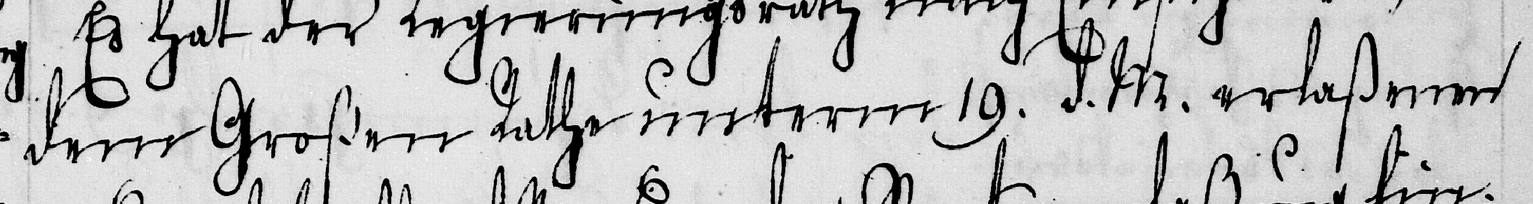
dem Großen Rathe unterm 19. d. M. erlaßenen
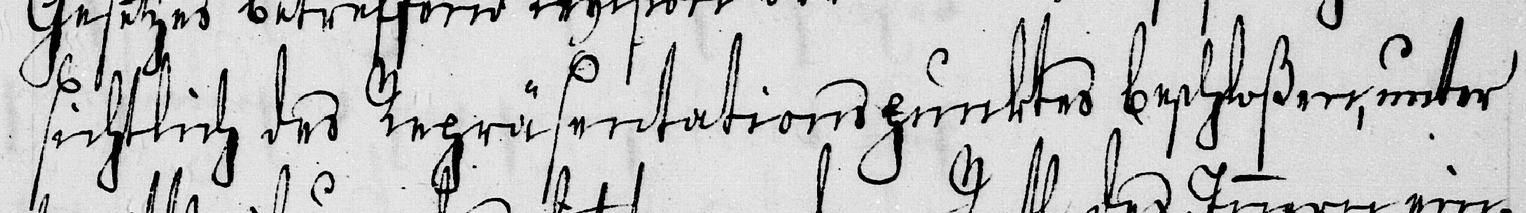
sichtlich des Repräsentationspunktes beschloßen, unter
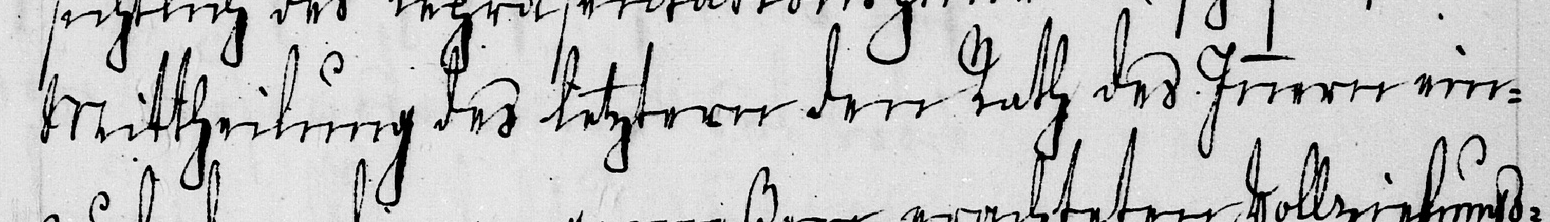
Mittheilung des letztern den Rath des Innern ein¬
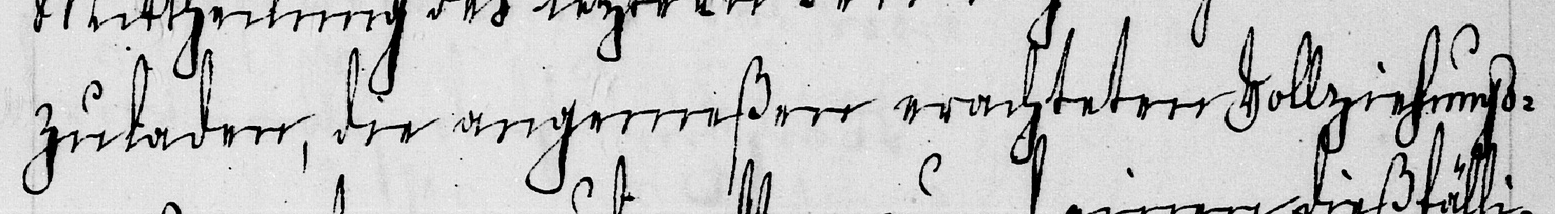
zuladen, die angemeßen erachteten Vollziehungs¬
